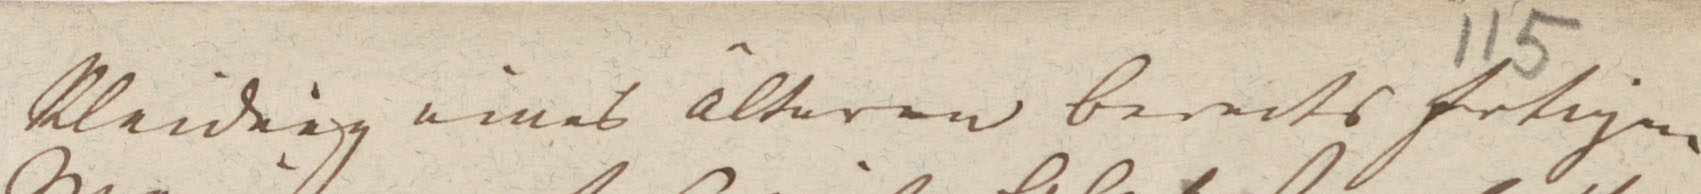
kleidung eines älteren bereits fertigen
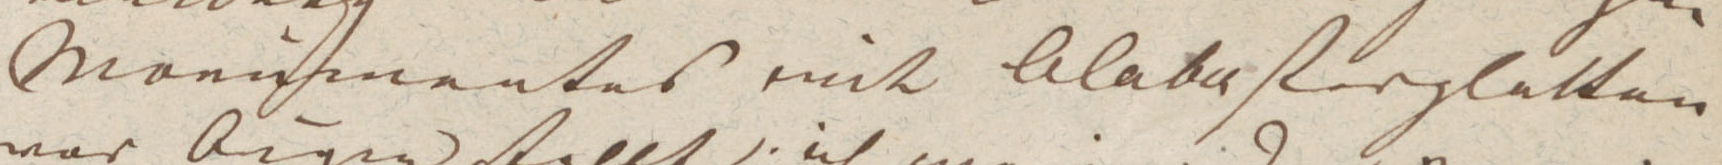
Monumentes mit Alabasterplatten
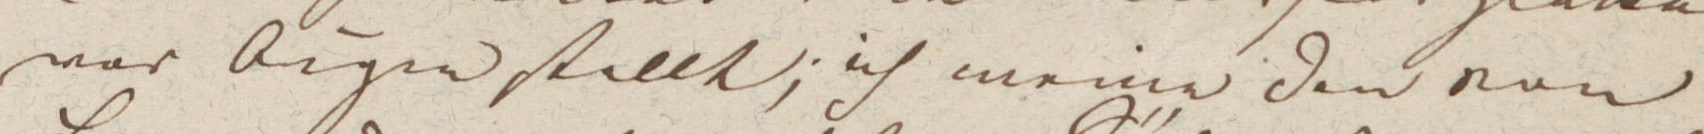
vor Augen stellt; ich meine den von
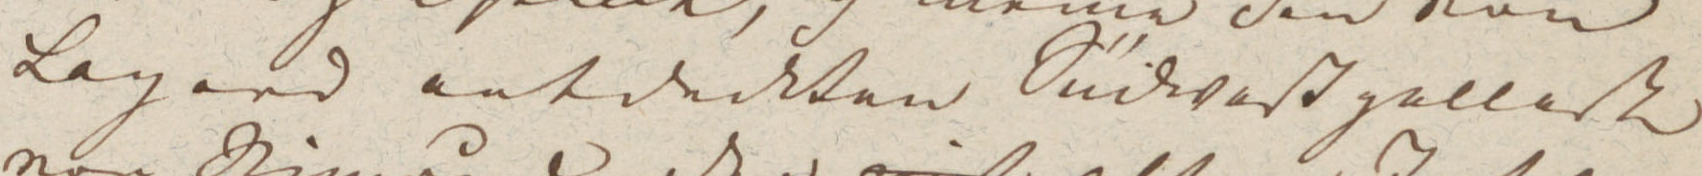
Layard entdeckten Südwestpallast
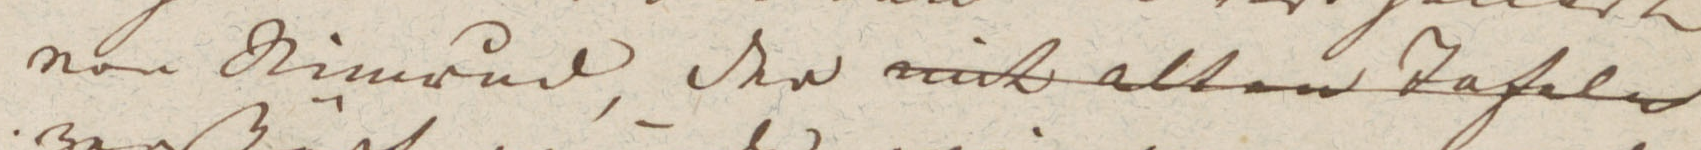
von Nimrud, der mit alten Tafeln
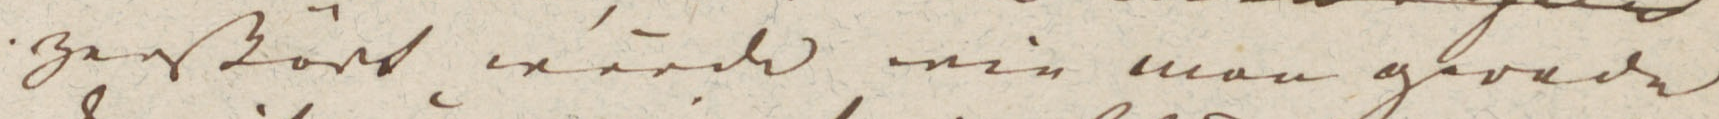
zerstört wurde wie man gerade
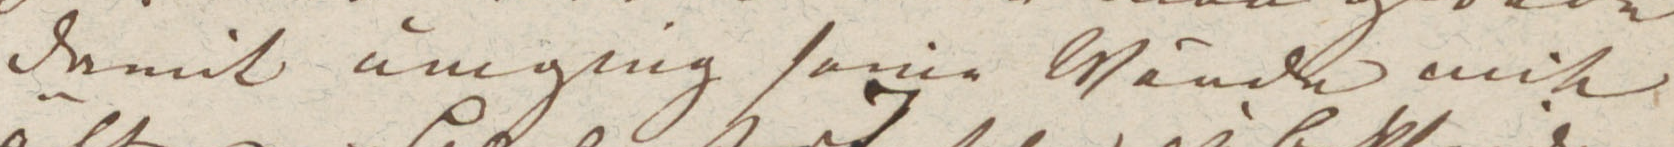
damit umging seine Wände mit
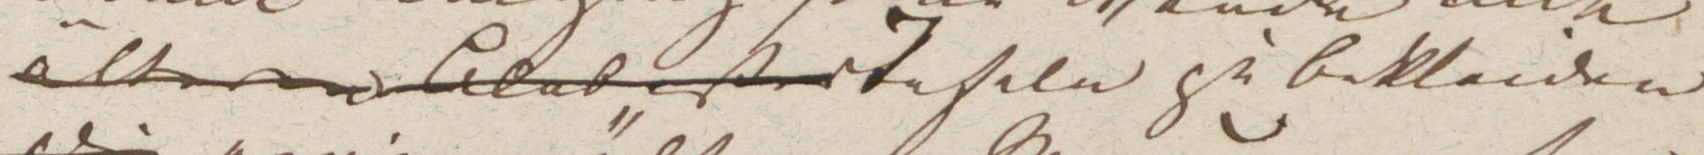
älteren AlabstertTafeln zu bekleiden
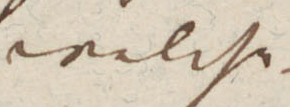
welche
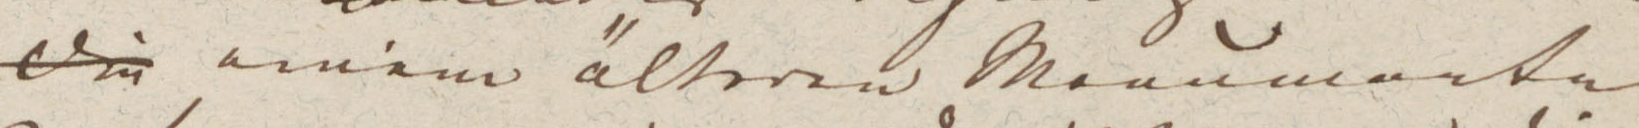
die einem älteren Monumente
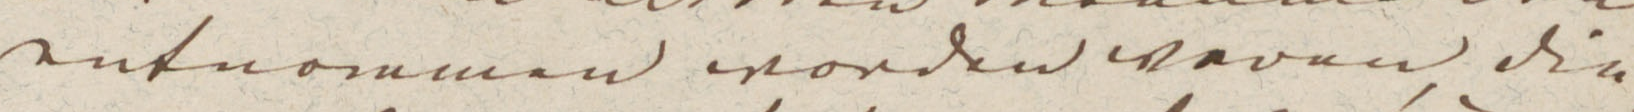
entnommen worden waren, die
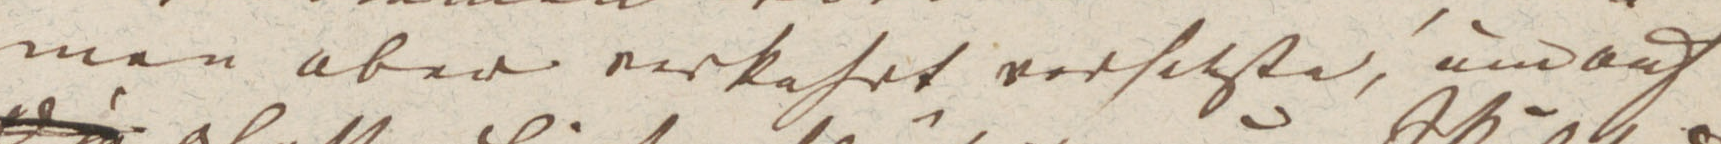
man aber verkehrt versetzte, um auf
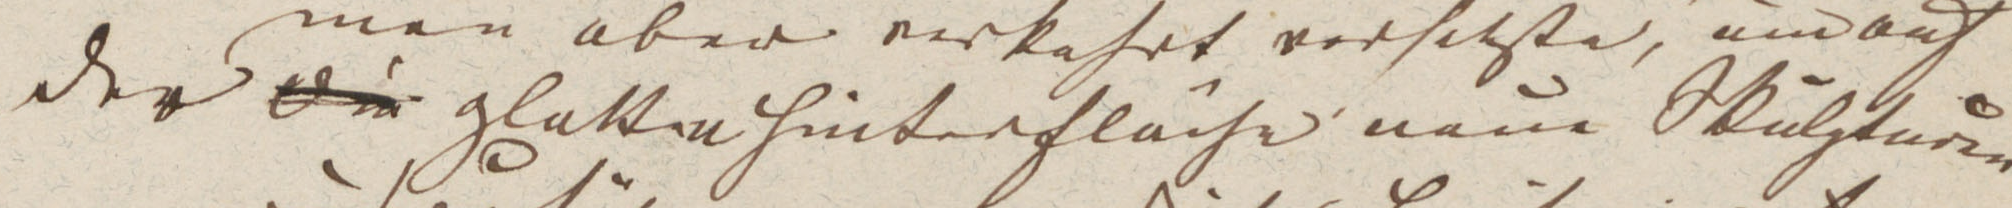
der die glatten Hinterfläche neue Skulpturen
